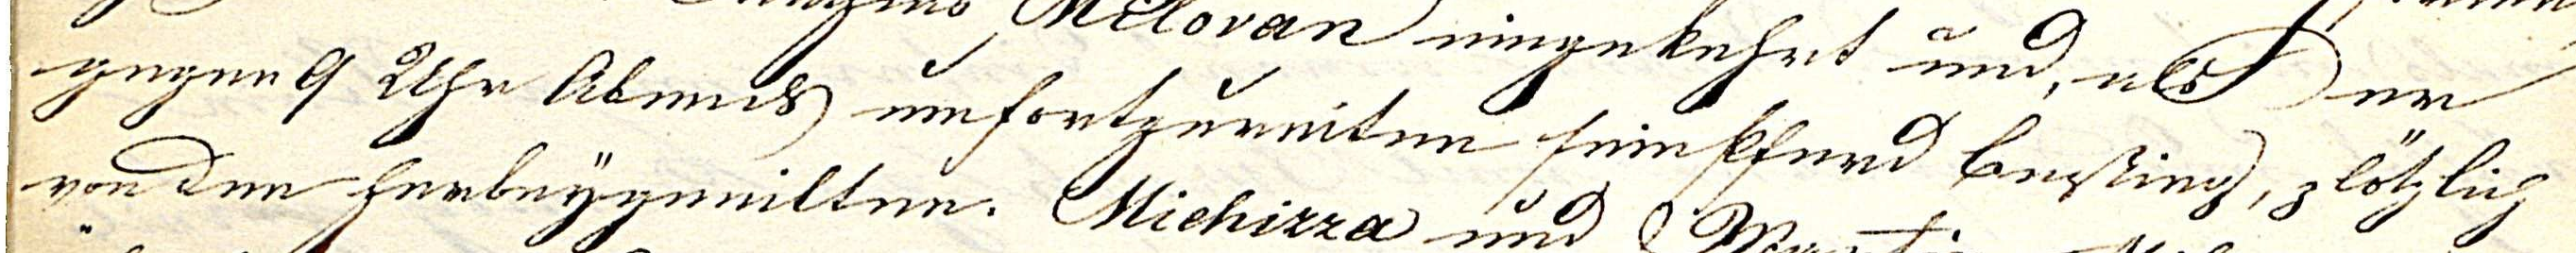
gegen 9 Uhr Abends um fortzureiten sein Pferd bestieg, plötzlich
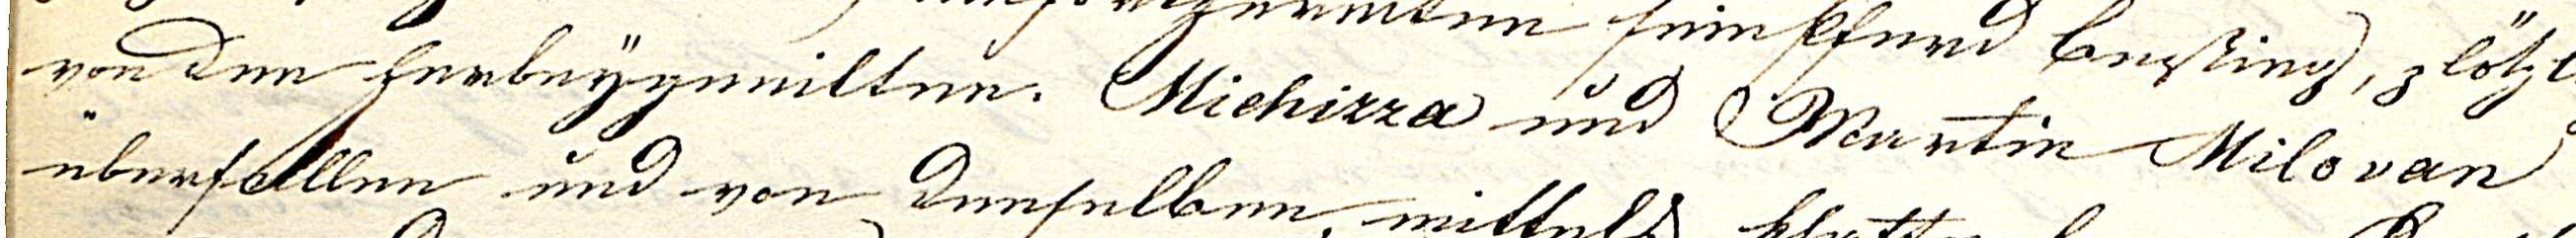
von dem herbeygeeilten Miehizza und Martin Milovan
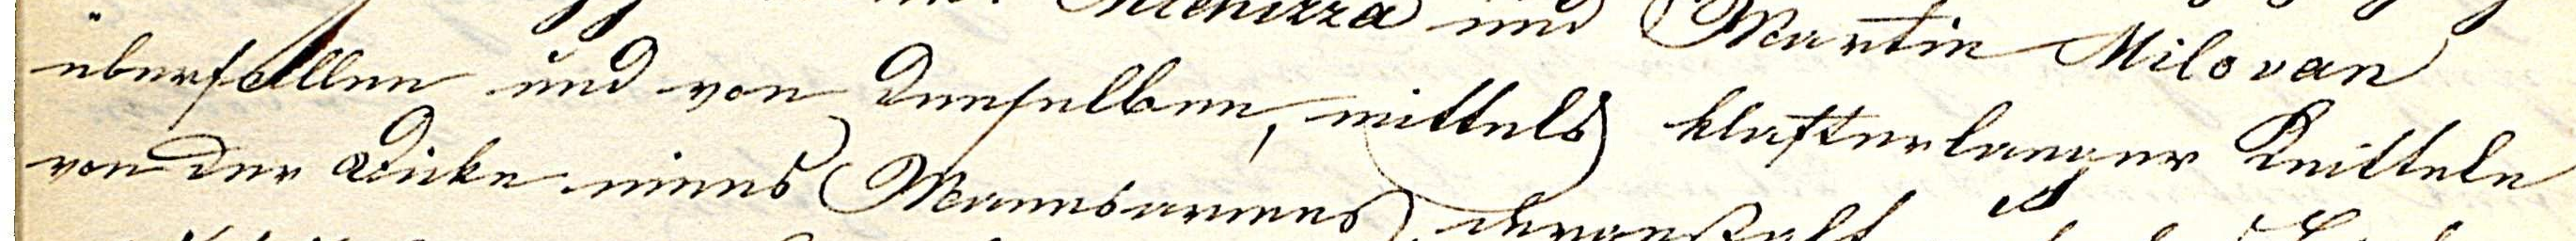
überfallen und von denselben, mittels klasterlanger Knitteln
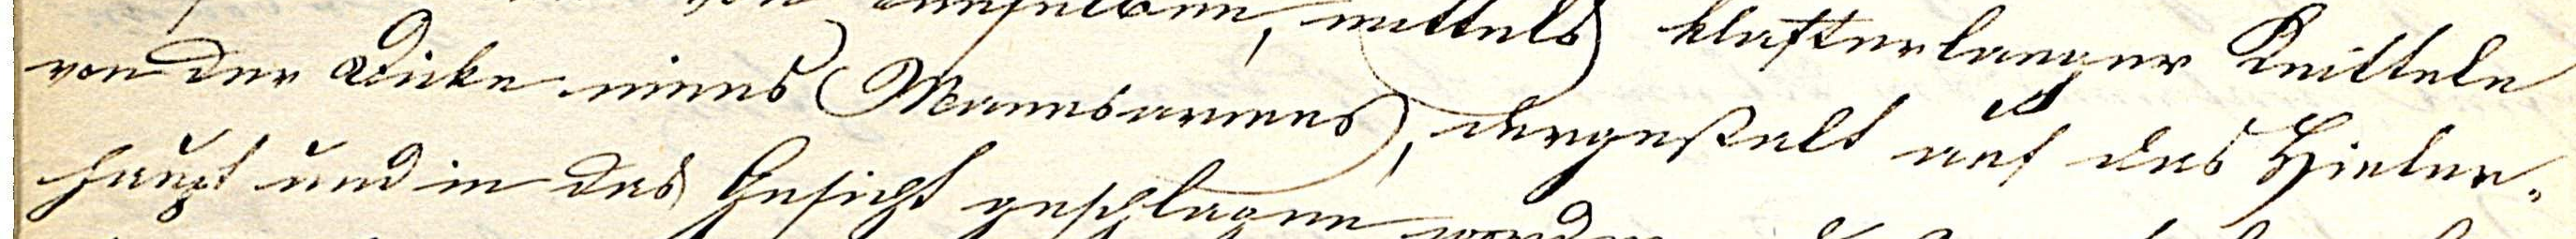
von der Dicke eines Mannesarmes, dergestalt auf das Hinter¬
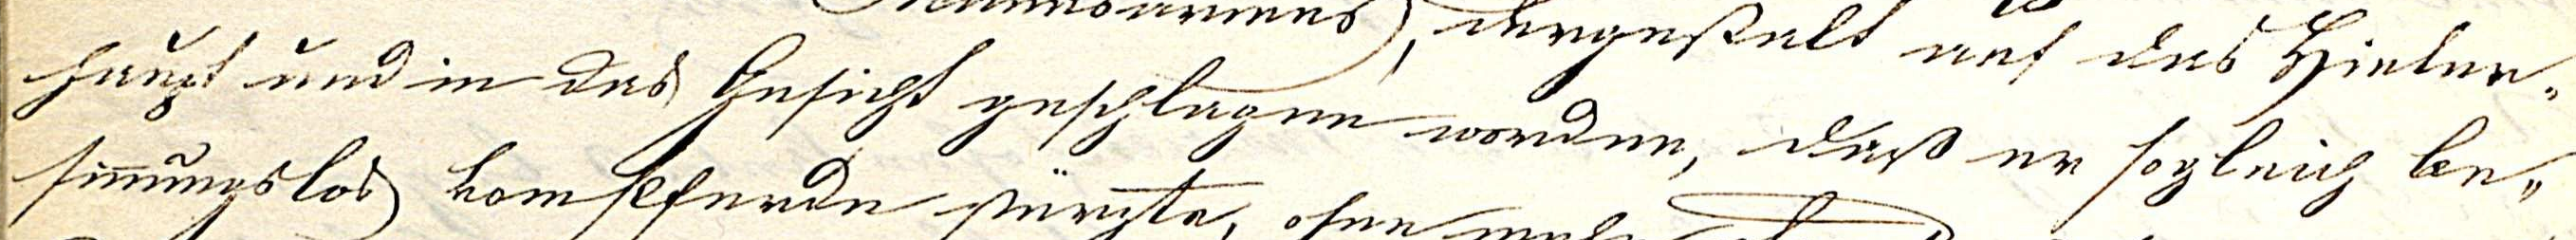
haupt und in das Gesicht geschlagen worden, daß er sogleich be¬
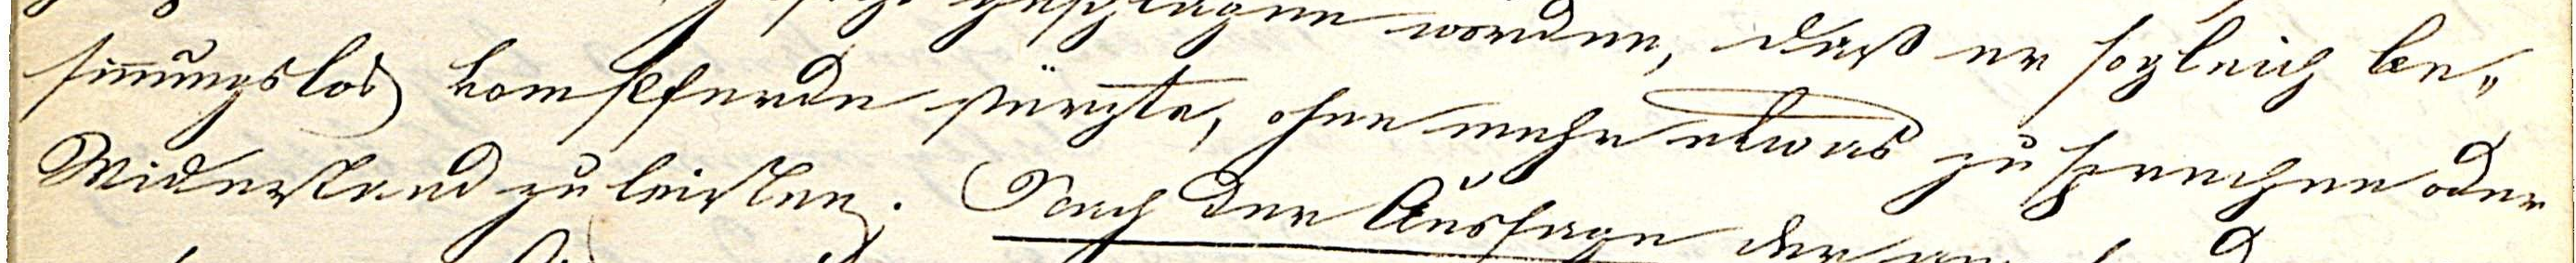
sinnungslos vom Pferde stürzte, ohne mehr etwas zu sprechen oder
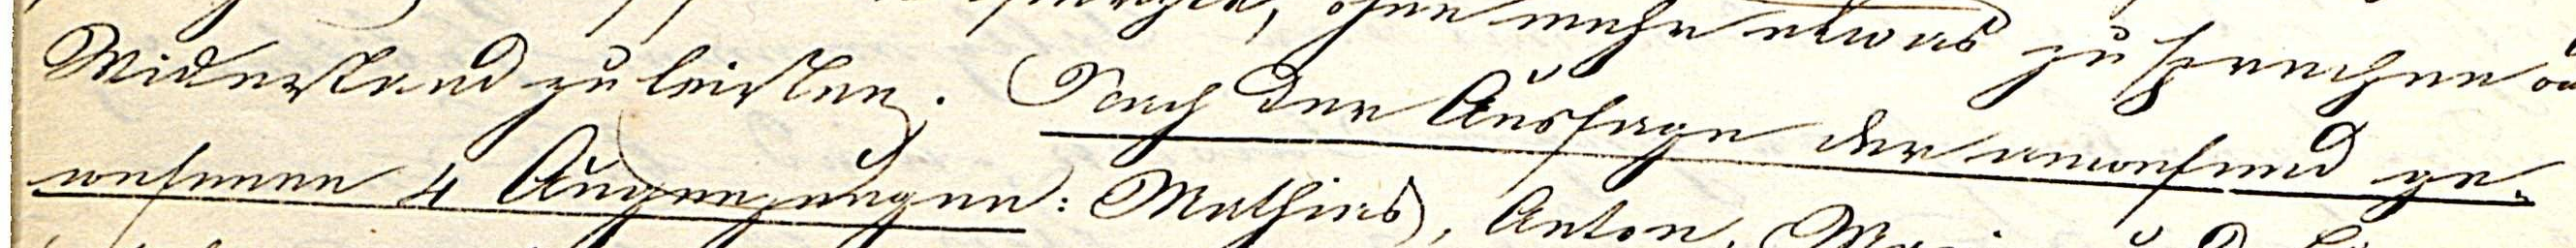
Widerstand zu leisten. Nach der Ausfrage der anwesend ge¬
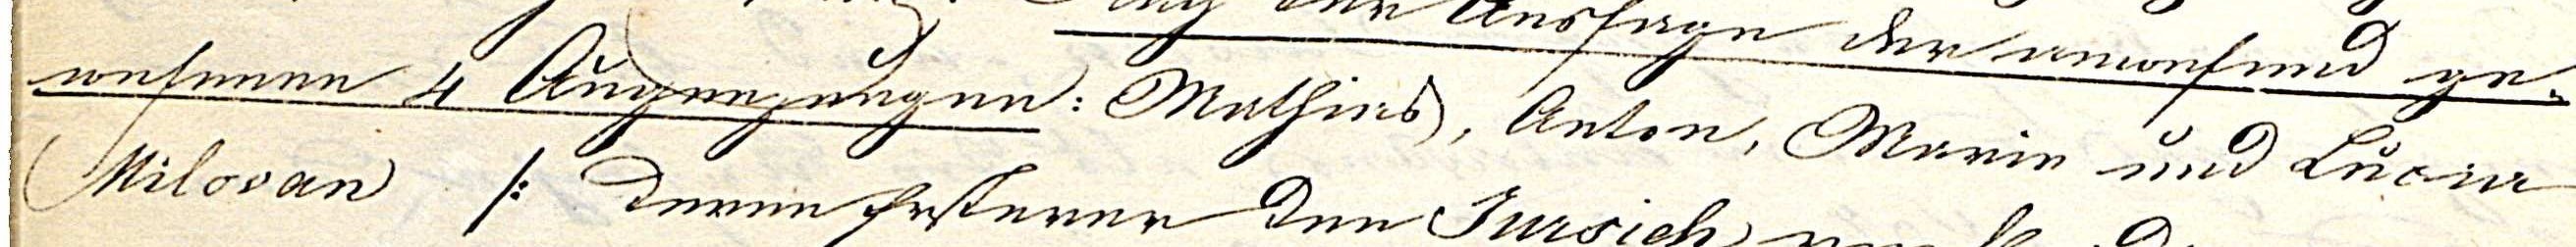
wesenen 4 Augenzeugen: Mathias, Anton, Marie und Lucia
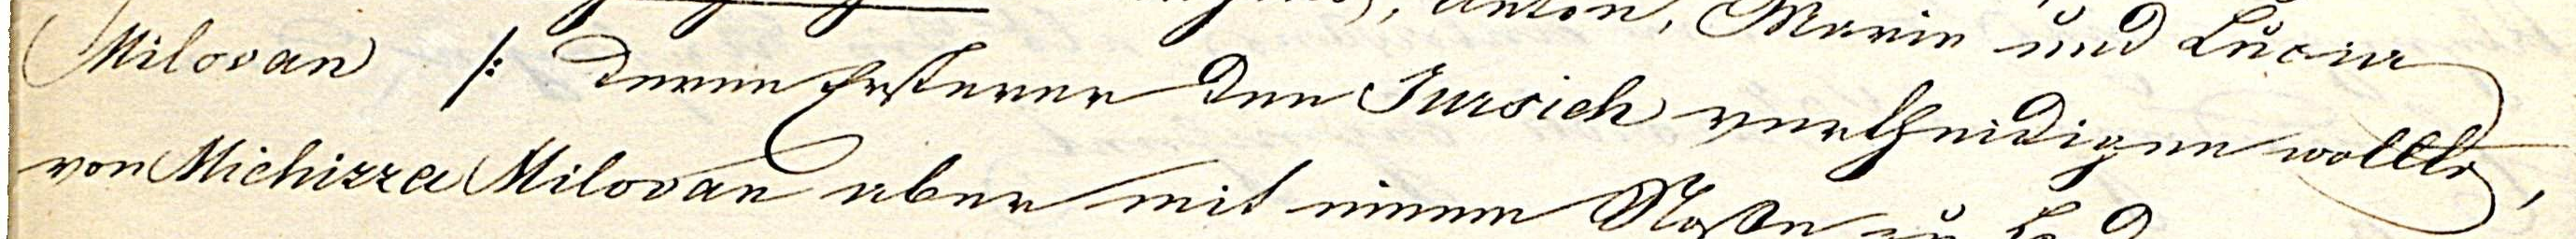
Milovan (deren Ersterer den Jursich vertheidigen wollte,
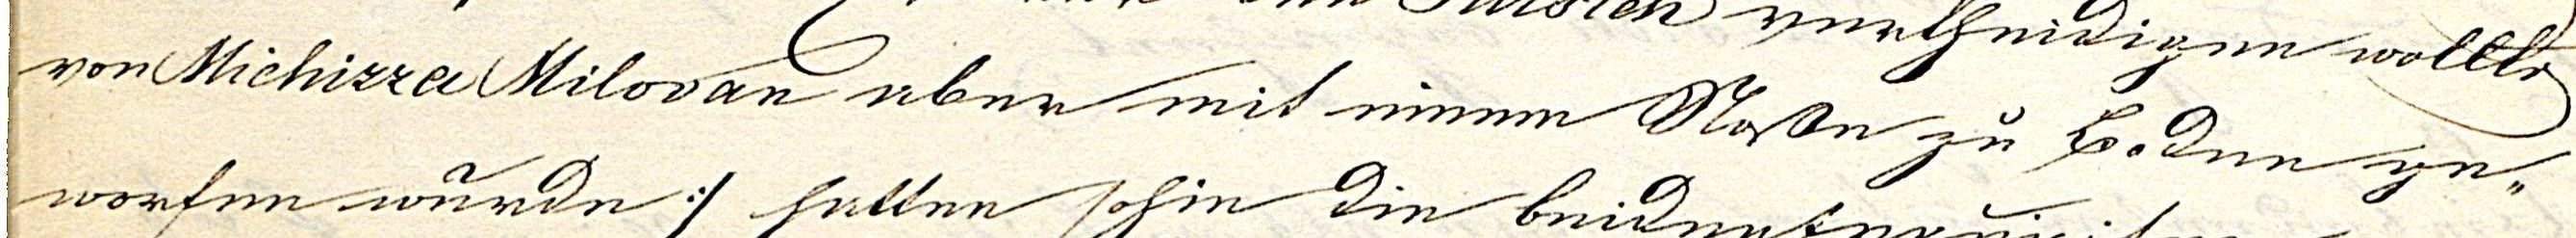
von Michizza Milovan aber mit einem Stoße zu Boden ge¬
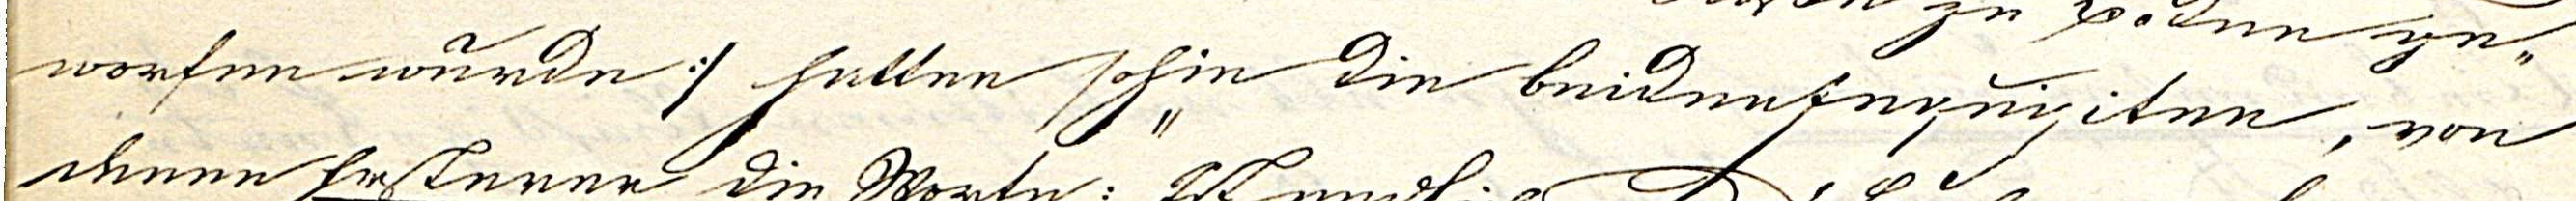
worfen wurde) hatten sohin die beiden Inquisiten, von
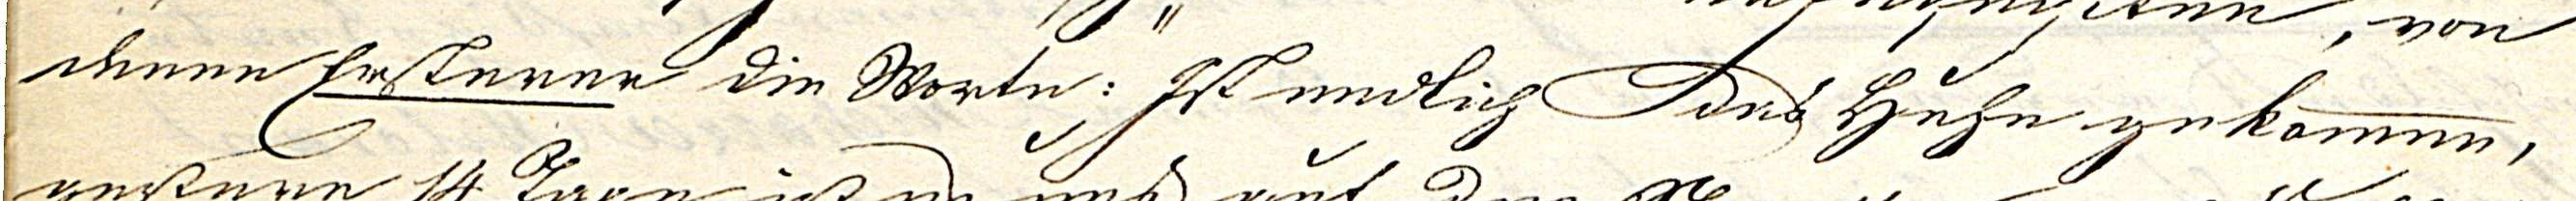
denen Ersterer die Worte: „Ist endlich das Hehn gekommen,
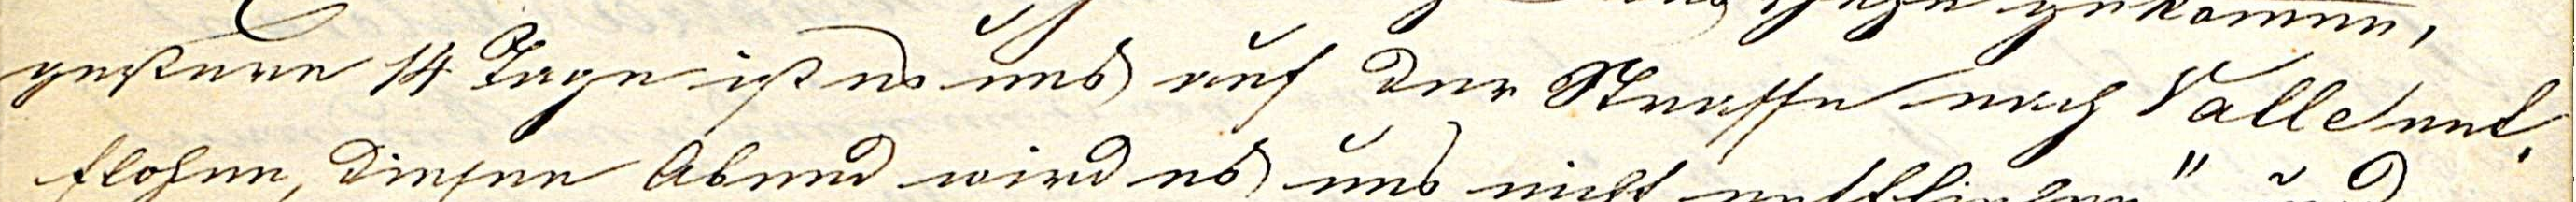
gestern 14 Tage ist es uns auf der Strasse nach Valle ent¬
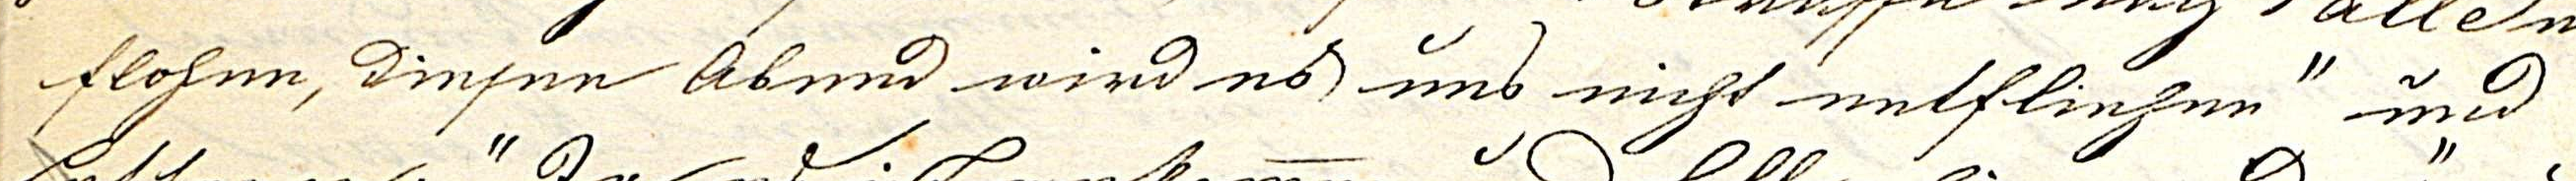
flohen, diesen Abend wird es uns nicht entfliehen“ und
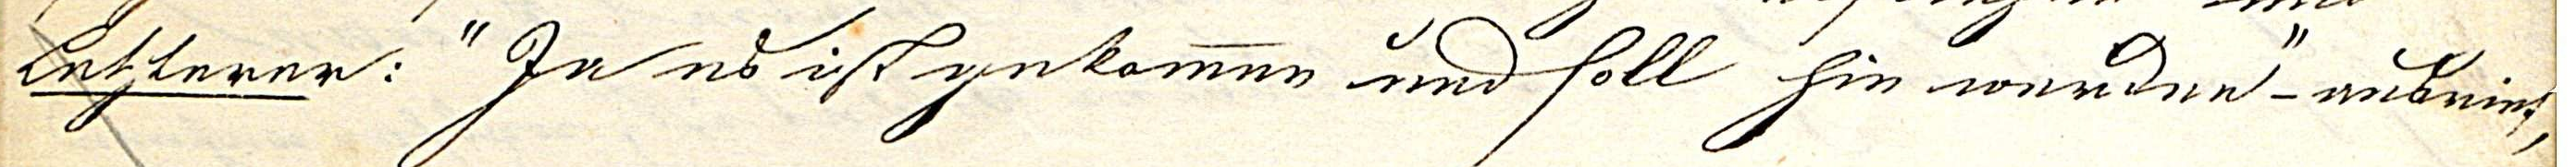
Letzterer: „Ja es ist gekommen und soll hin werden“ – ausrief,
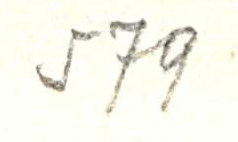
579
